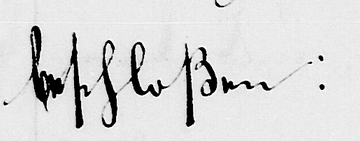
beschloßen:
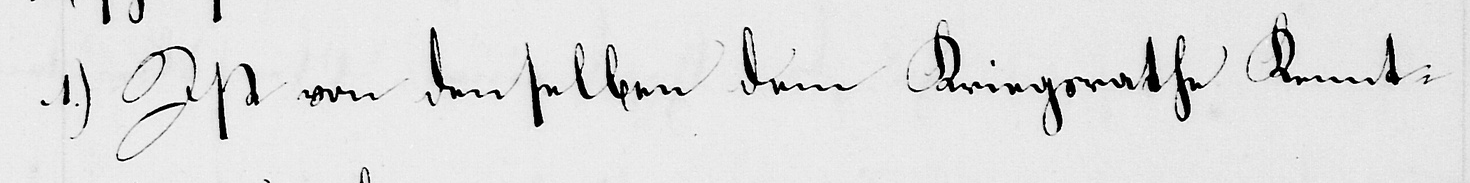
1.) Ist von denselben dem Kriegsrathe Kennt¬
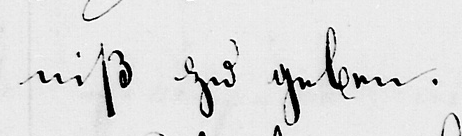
niß zu geben.
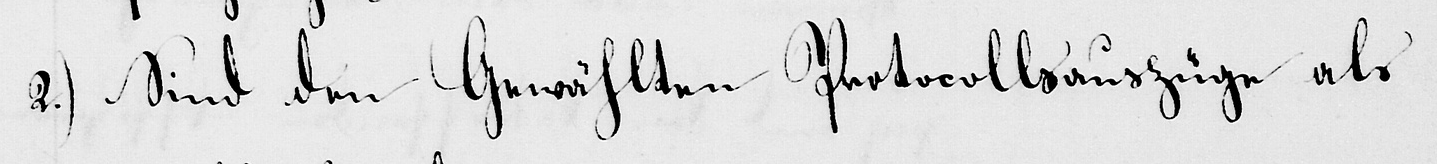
2.) Sind den Gewählten Protocollsauszüge als
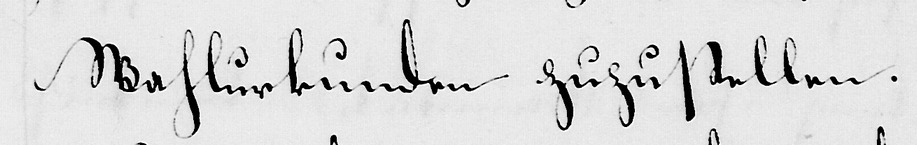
Wahlurkunden zuzustellen.
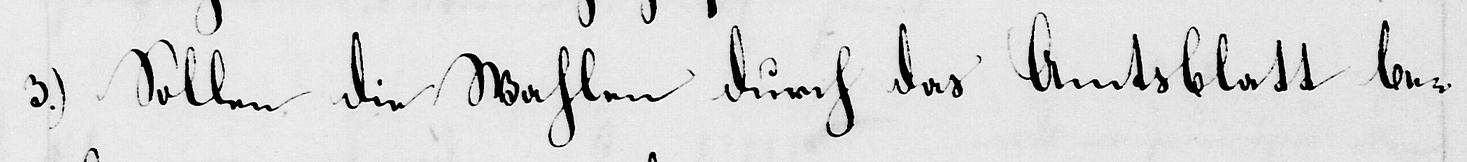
3.) Sollen die Wahlen durch das Amtsblatt be¬
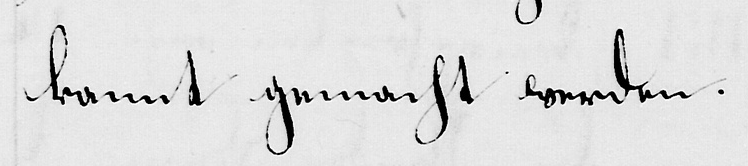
kannt gemacht werden.
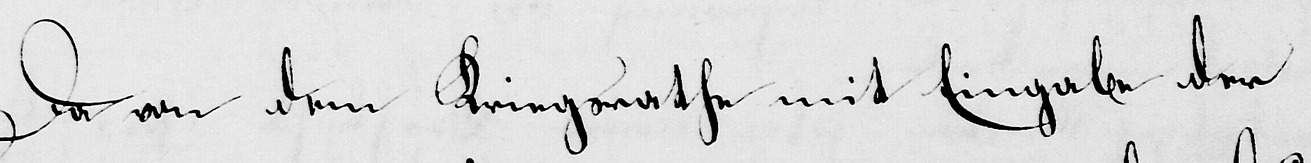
Da von dem Kriegsrathe mit Eingabe der
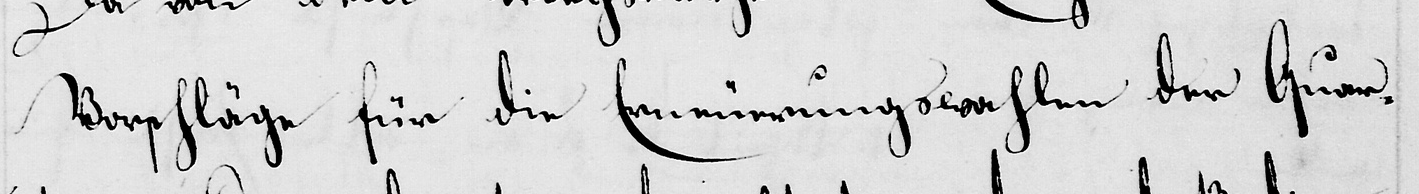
Vorschläge für die Erneuerungswahlen der Quar¬
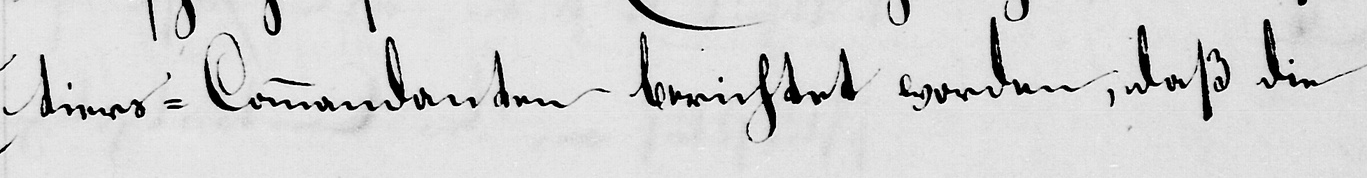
tiers-Commandanten berichtet worden, daß die
